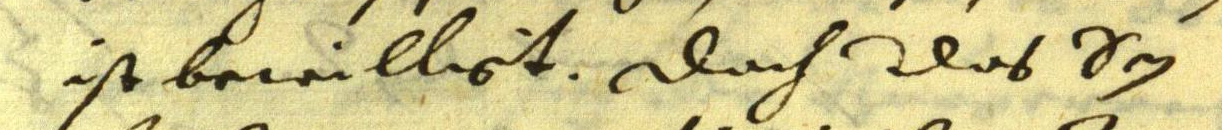ist bewilligt. doch das Sȳ
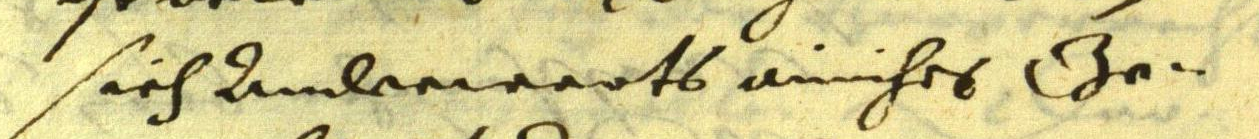sich Anderwerts ainiches Ge¬
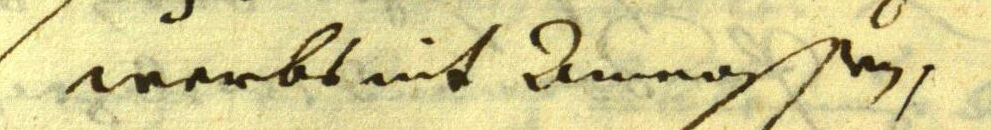werbs nit Anmassen,
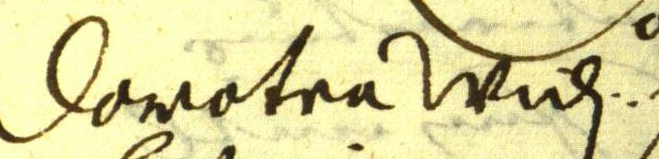Dorotea Wid¬
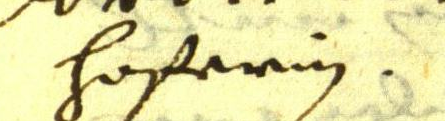hoferin.
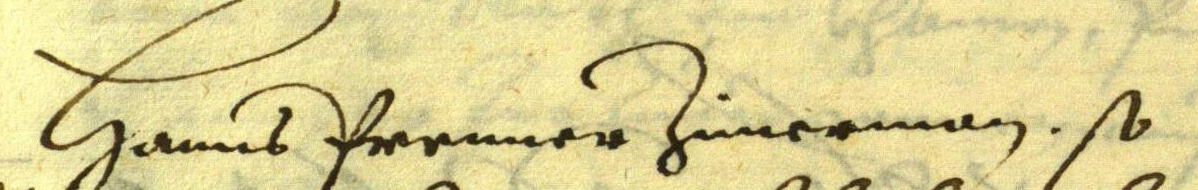Hanns Prenner Zimerman. so
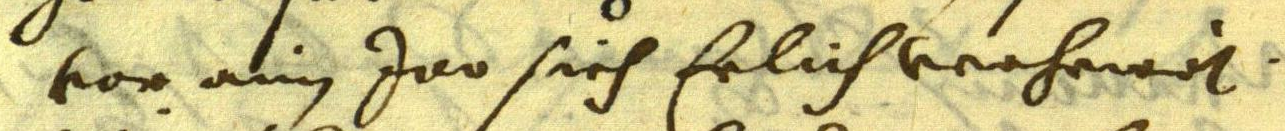vor aim Jar sich Erlich verheirat.
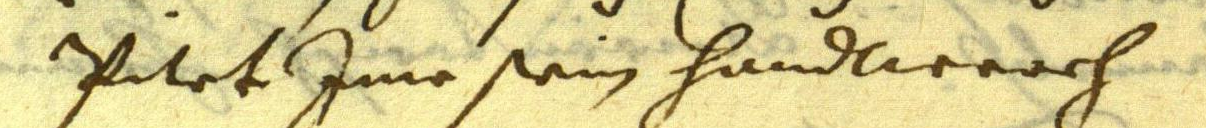Pitet Ime sein handtwerch
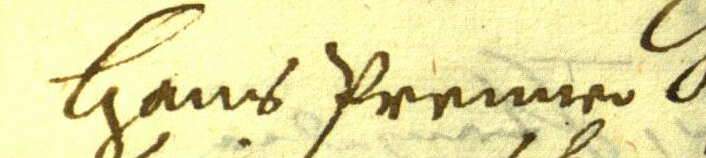Hans Prenner
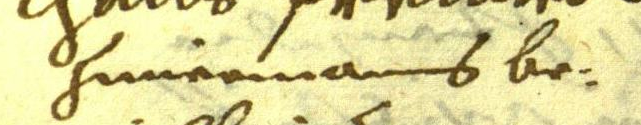Zimermanns be¬
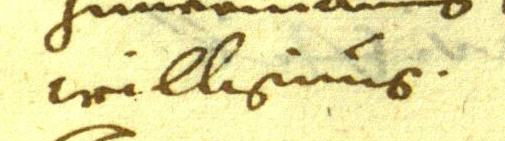willigūng.
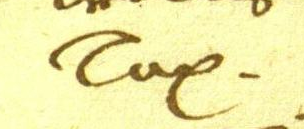Tax.
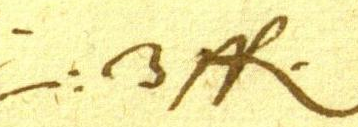—: 3 fl.
